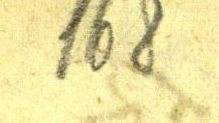168
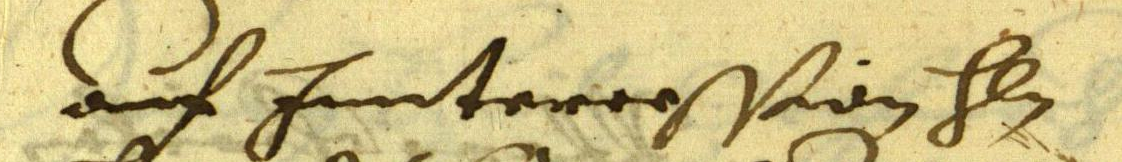aūf Intercession hln
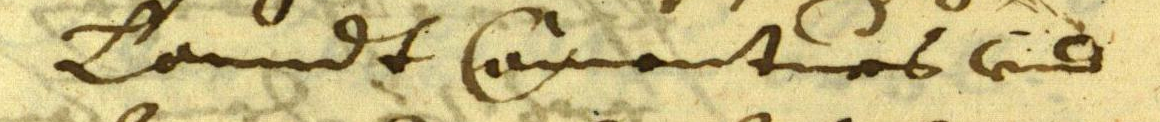Lanndt Comentūrs vnd
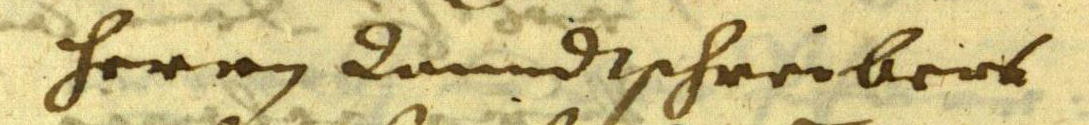herrn Lanndtschreibers
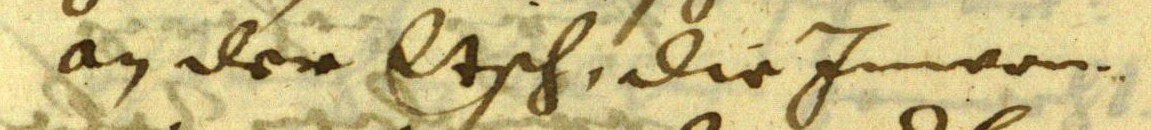an der Etsch, die Inwon¬
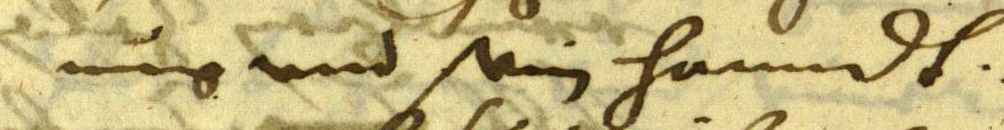ūng vnd sein hanndt¬
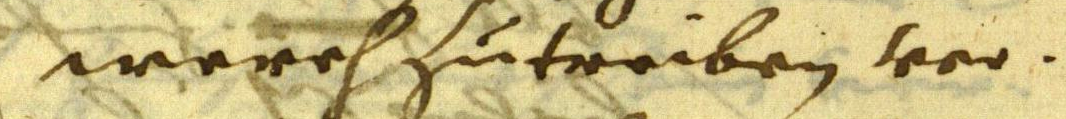werch Zūtreiben ver¬
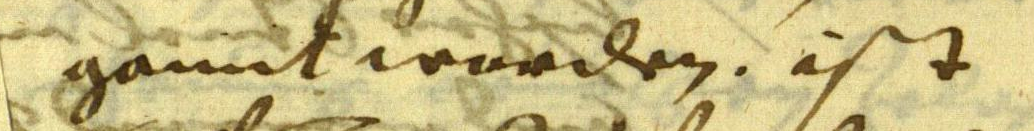gonnt worden. ist
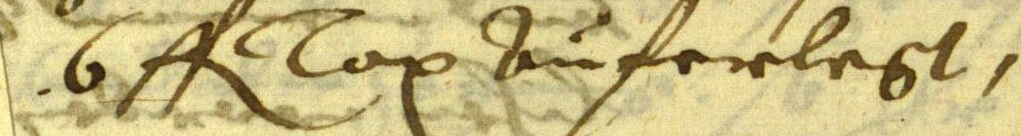.6 fl Tax aūferlegt,
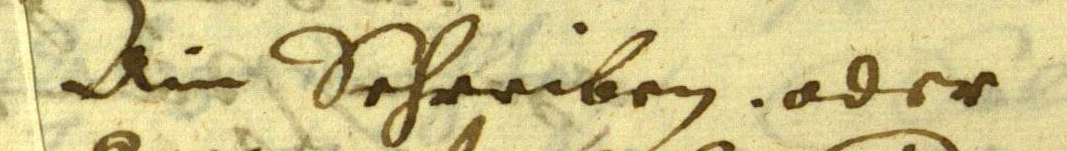Ain Schreiben. oder
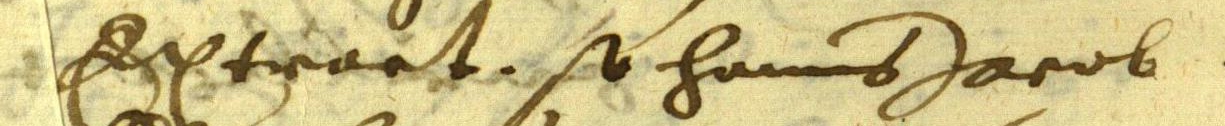Extract. so hanns Jacob
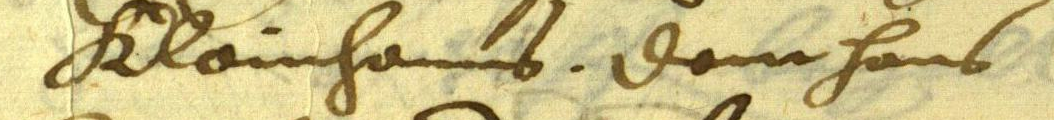Klainhanns. dem hans
